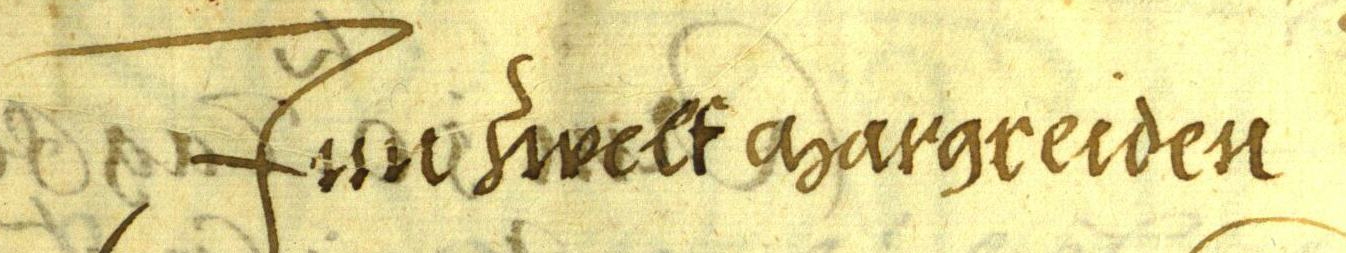Inn zwelf Margreiden
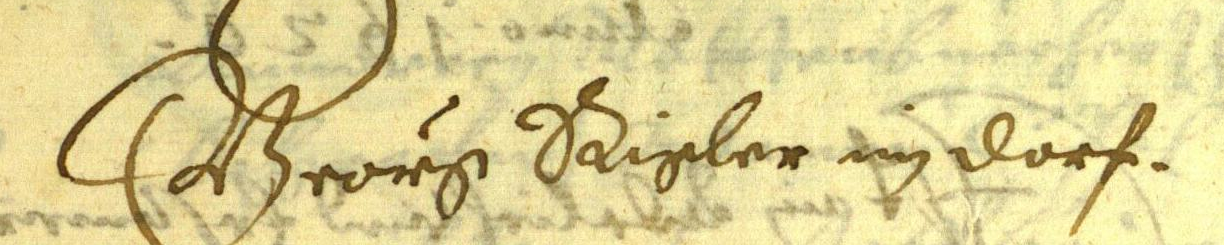Geōrg Rigler im dorf.
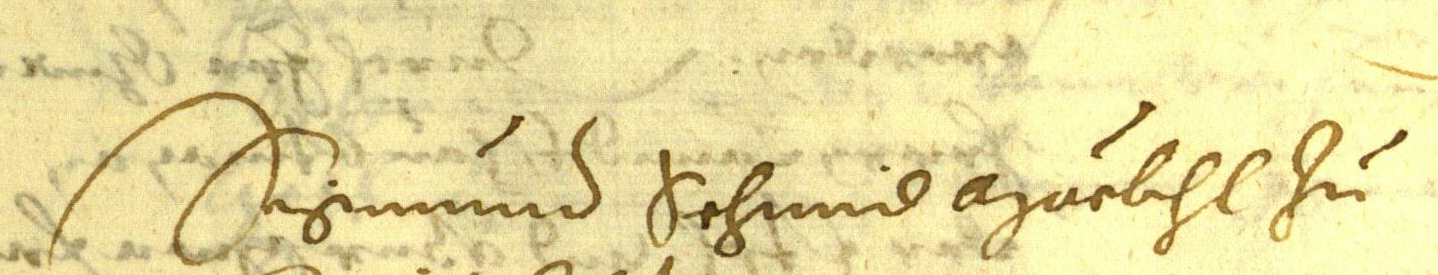Sigmūnd Schmid Māckhl Zū
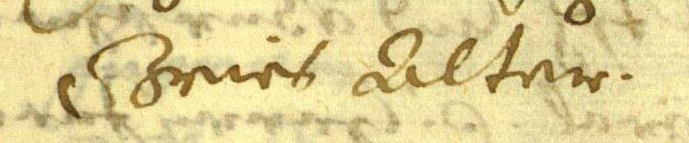Gries Alter.
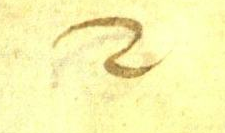2
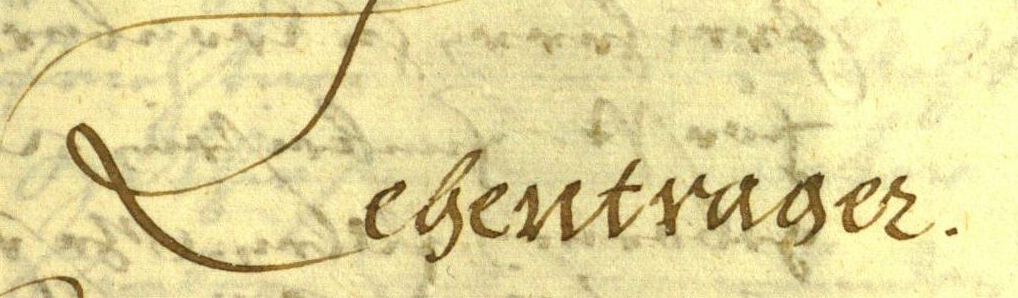Lehentrager.
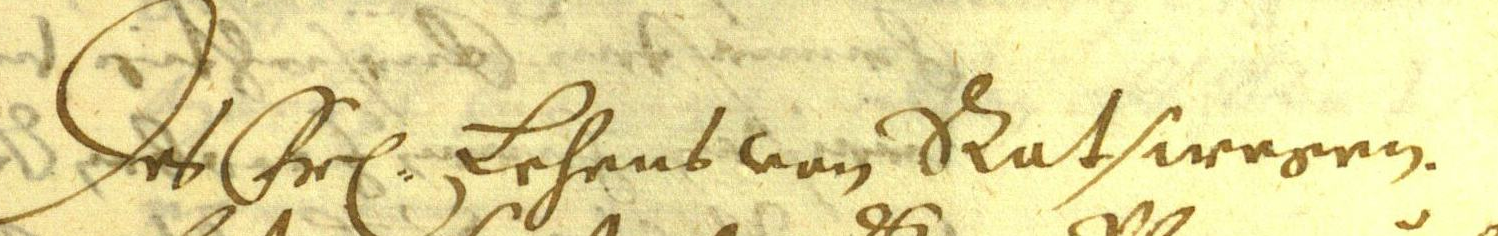Des Frl: Lehens von Ratswegen.
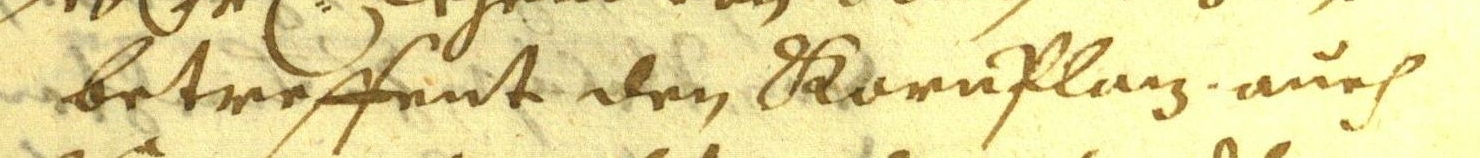betreffent den KornPlatz. aūch
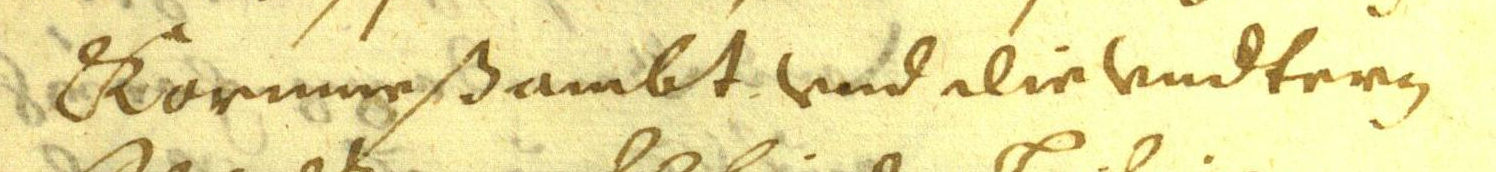Kornmeßambt vnd die vndtern
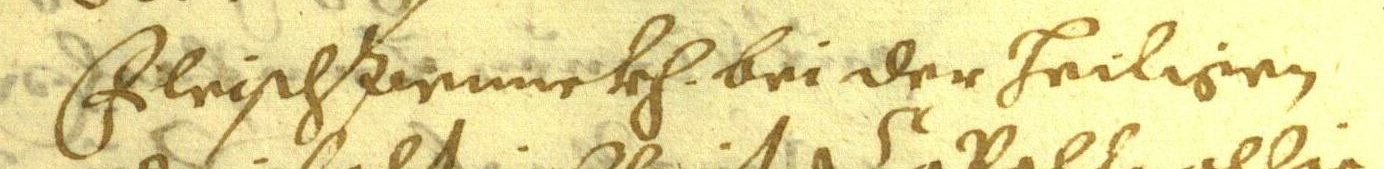Fleischpennckh. bei der Heiligen
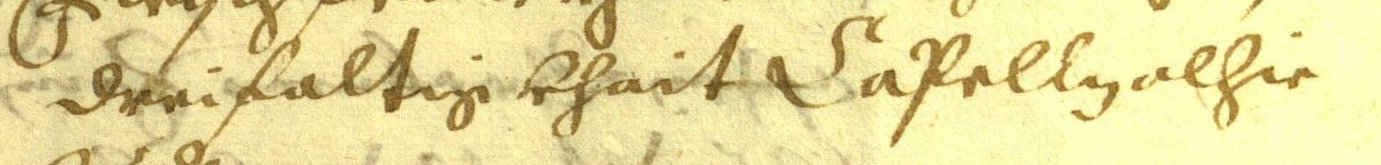dreifaltigkhait CaPelln alhie
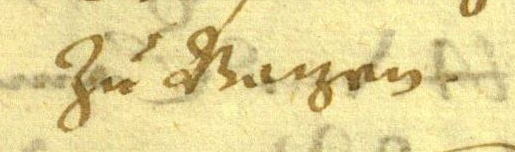Zū Bozen.
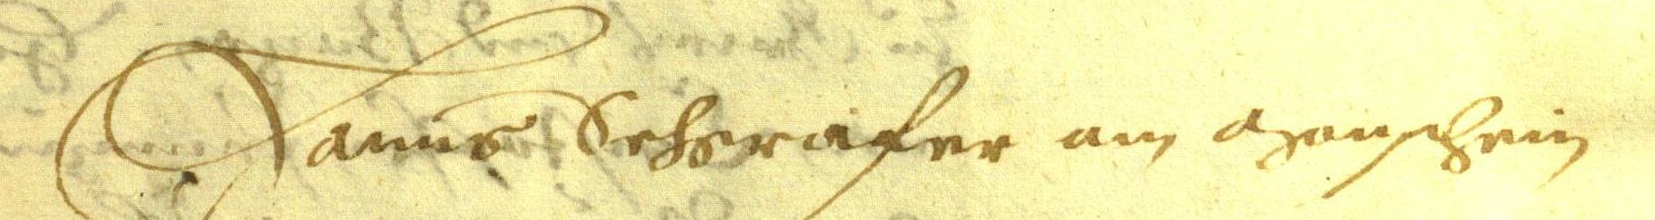Hanns Schgrafer am Monschein
